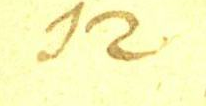12
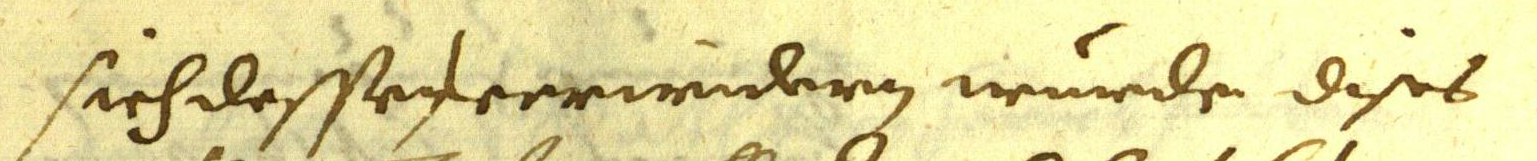sich dessen verwidern wūrde dises
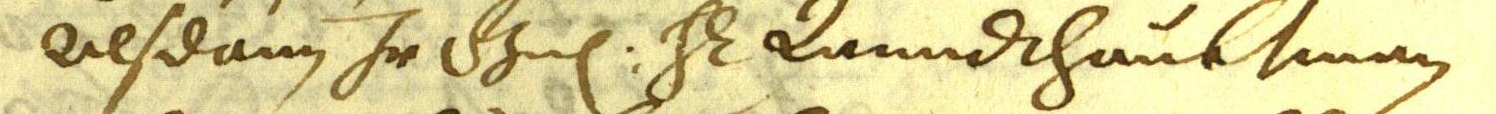Alsdann Ir Gn: H Landthaūbtman
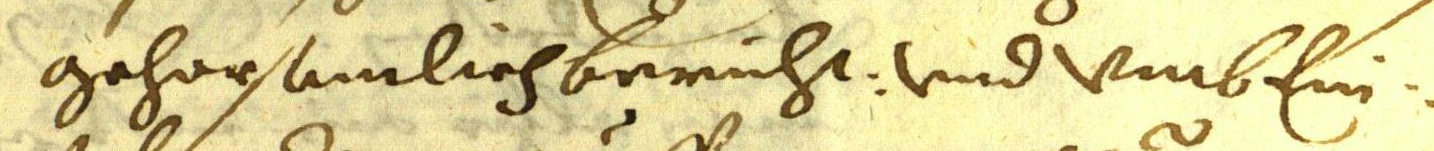gehorsamblich bericht. vnd vmb Ein¬
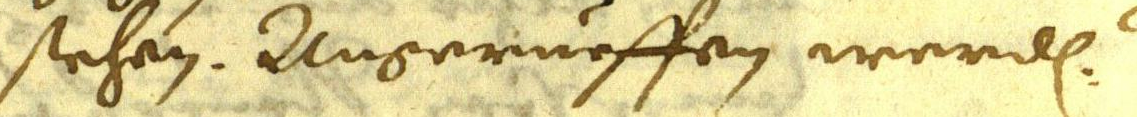sehen. Angerūeffen werd.
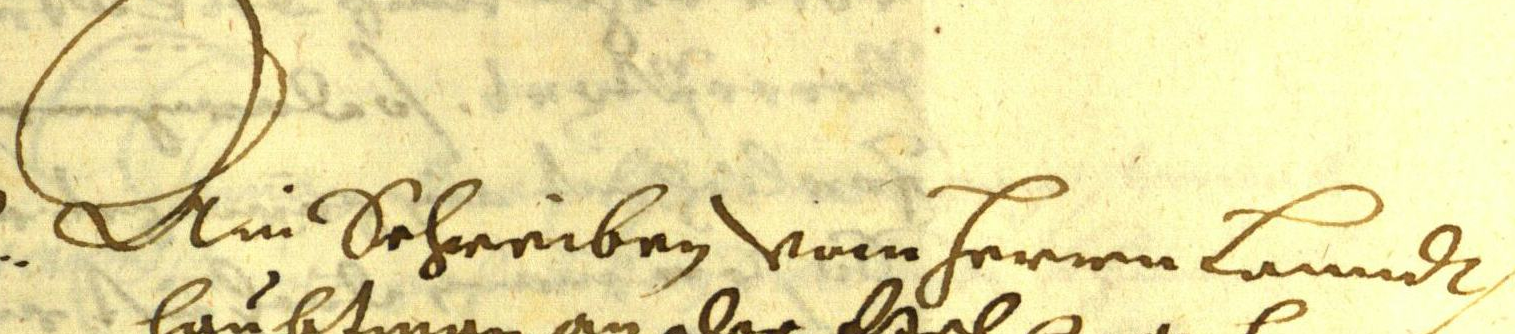Ain Schreiben vom herrn Lanndts¬
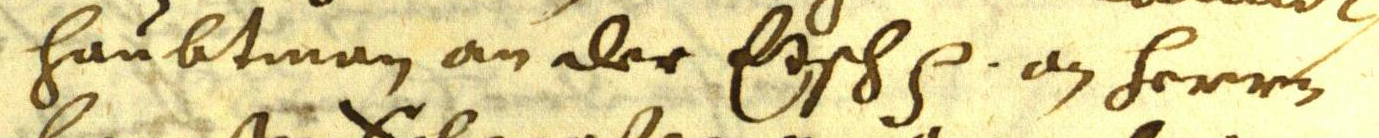haūbtman an der Etsch etc. an herrn
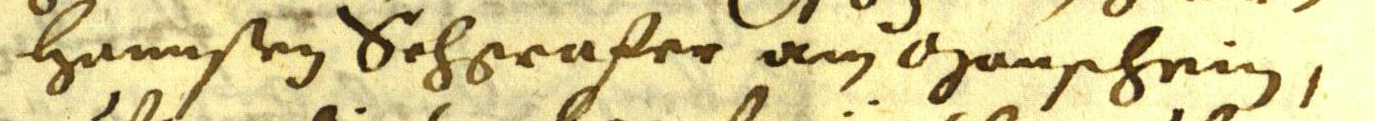Hannsen Schgrafer am Monschein,
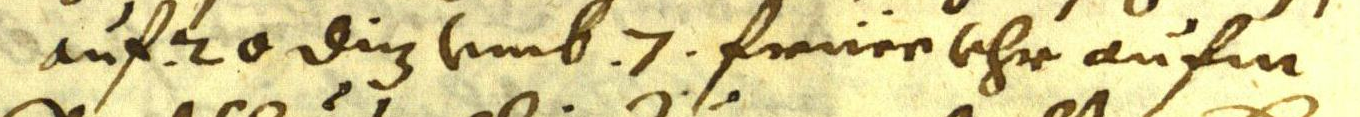aūf. 20 diz vmb .7. früer vhr aūfm
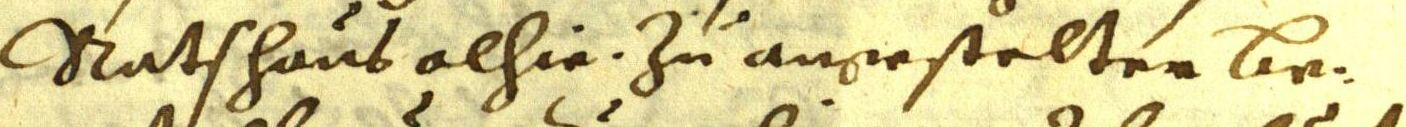Ratshaūs alhie. Zū angestelter be¬
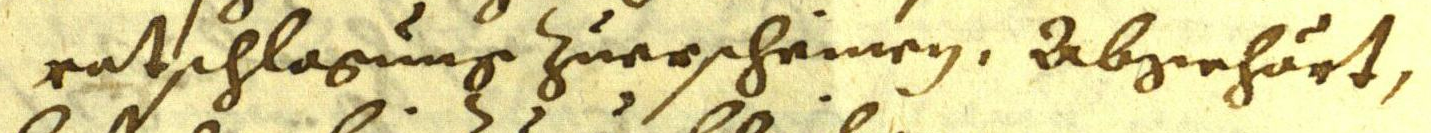ratschlagūng Zūerscheinen, Abgehōrt,
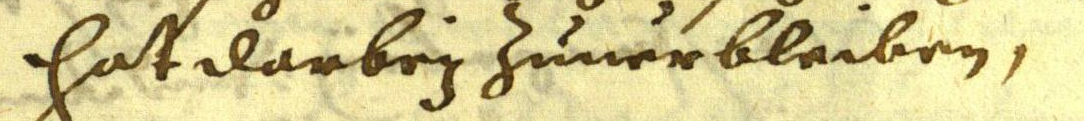hat darbej Zūuērbleiben,
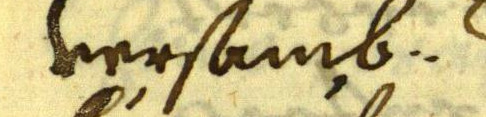Versamb¬
